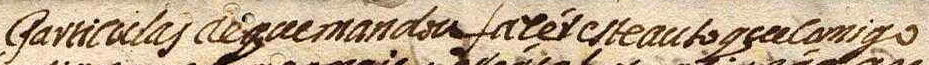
Particulas de que mandou fazer este auto que comigo
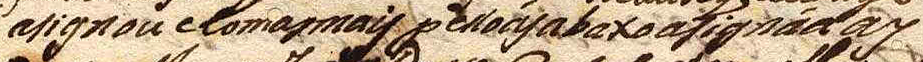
asignou e com as mais pessoas abaxo asignádas
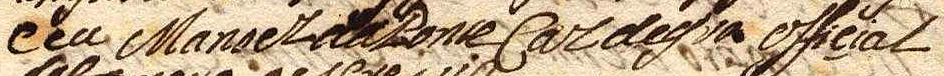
e eu Manoel da Ponte CaLdeyra officiaL
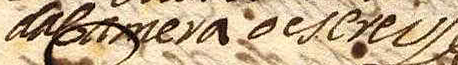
da Camera o escrevj
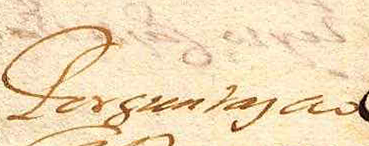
Perguntas ao
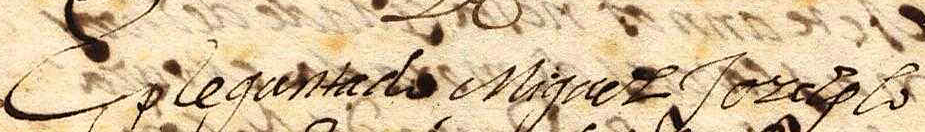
E pReguntado MigueL Jozehp Co
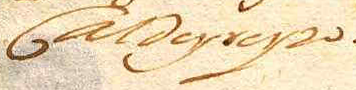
Caldeyreyro.
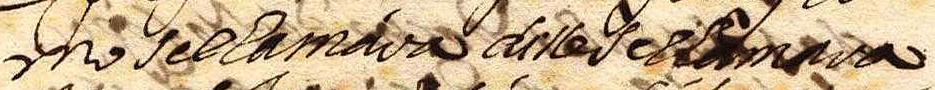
mo se chamava disse se chamava
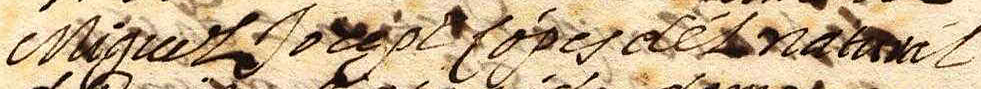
MigueL Jozeph Lópes deL natural
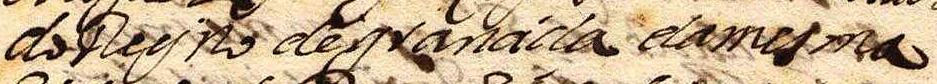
do Reyno de granáda da mesma
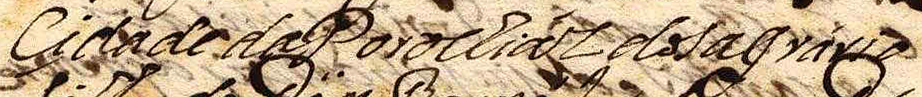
Cidade da PorochiaL do sagrario
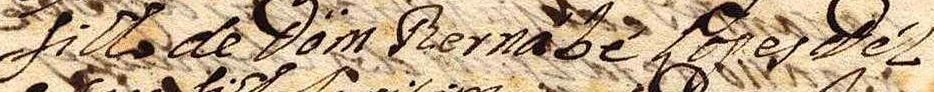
filho de Dom Bernabé Lopes e DéL
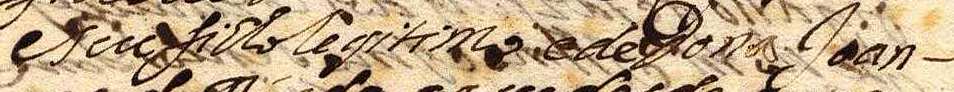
e seu filho legitimo e de Dona Joan
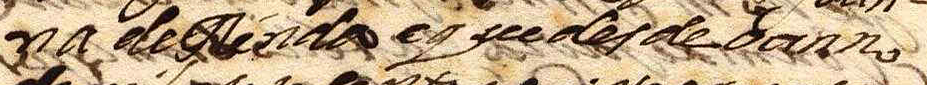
na de Renda e que desde o anno
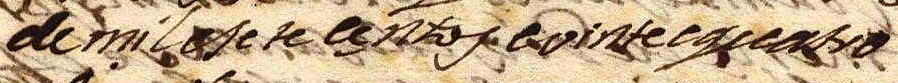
de mil e setecentos e vinte e quatro
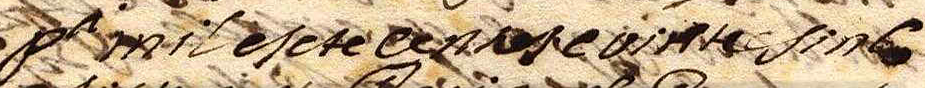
p.a mil e setecentos e vinte sinco
